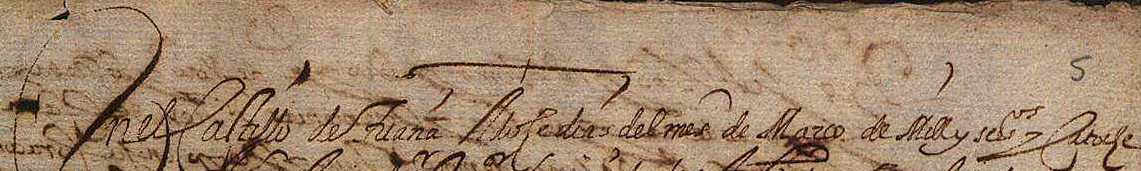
En el Castillo de Triana A doze dias del mes de Março de Mill y seisos y Catorze
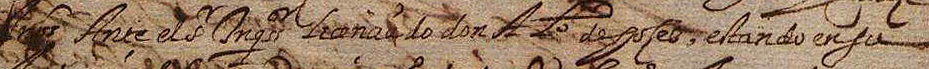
Anos̄ Ante el sr Inꝗssor Licenciado don AL̄o de hozes, estando em su
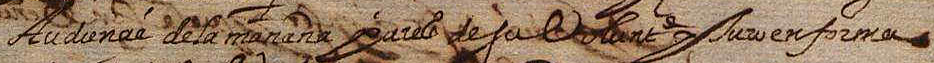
Audiencia de la manāna parecio de su Voluntd y Iuro en forma
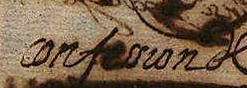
confession de
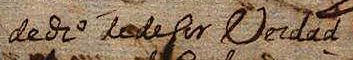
de dro de decir Verdad
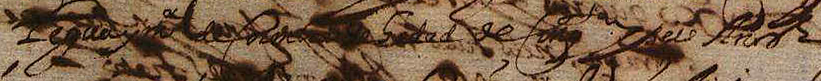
Legua y ma de Coimbra de hedad de Cinqta y seis Anos
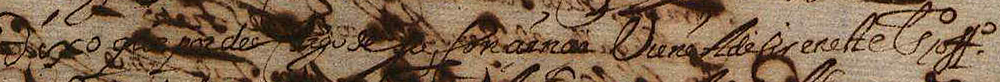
Dixo que por desCargo de su Conciencia Viene A decir en este sto off.o
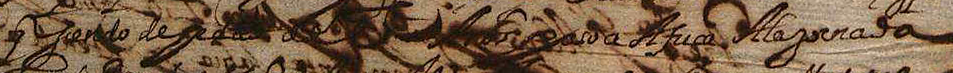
q̄ siendo de hedad de Vte Anos̄ paso a Africa A la jornada
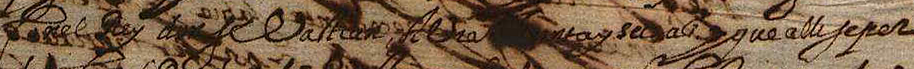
Con el Rey don SeVastian, Avia treinta y seis as̄ y que elle se per
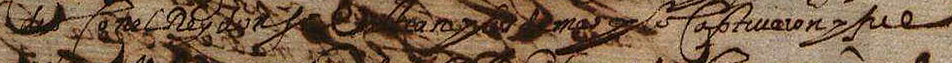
dio Con el Rey don seVastian y los demas y lo Captiuaron y fue
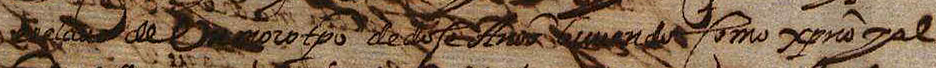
esclauo de Vn moro tpō de doze Anos̄ biuiendo Como xpnō y al
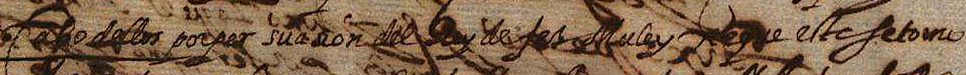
Cabo dellos por persuasion del Rey de fez Mueley Xeque este se torno
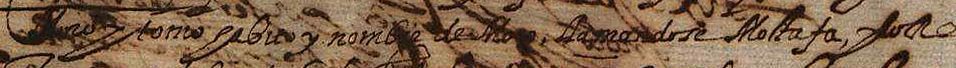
Moro y tomo habito y nombre de Moro, llamandose Mostafa, y lo Re
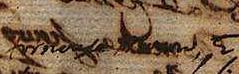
tornouse Mouro, E
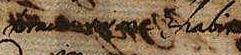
tomou nome E habito
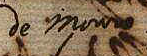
de mouro
